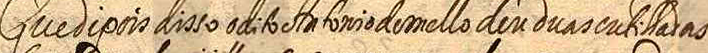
Que dipois disso o dito Antonio de mello deu duas cutilladas
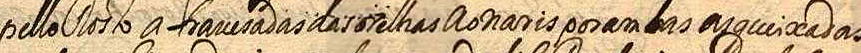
pello Rosto atrauesadas das orelhas ao naris por ambas as queixadas
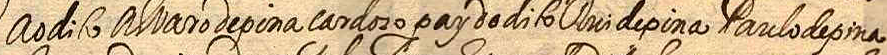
ao dito Alvaro de pina cardozo pay do dito Rui de pina Paulo de pina
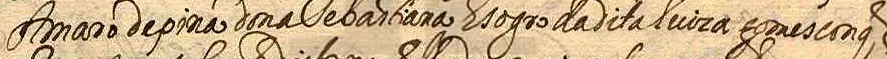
Amaro de pina dona sebastiana E sogro da dita luiza gomes con q̄
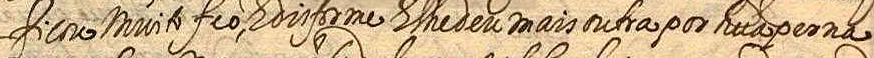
ficou muito feo, E disforme E lhe deu mais outra por huā perna
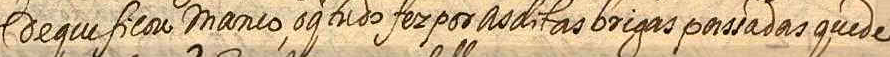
de que ficou manco, o q̄ tudo fez por as ditas brigas passadas que de
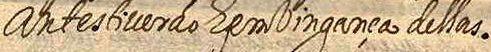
antes tiuerão E em vingança dellas.
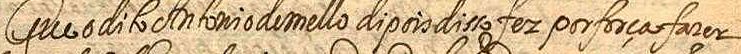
Que o dito Antonio de mello dipois disso fez por força fazer
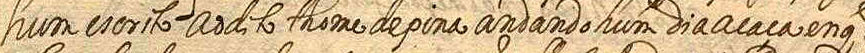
hum escrito ao dito thome de pina andando hum dia a caça en q̄
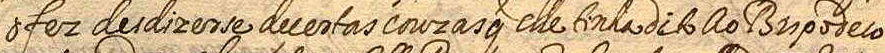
o fez desdizerse de certas couzas q̄ elle tinha dito ao Bispo de co
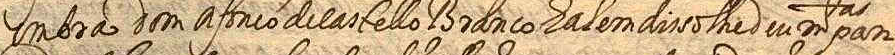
imbra dom afonco de castello Branco E alem disso lhe deu mtas pan
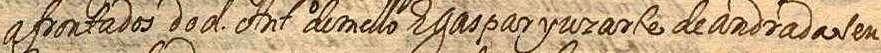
afrontados do d. Anto de mello E gaspar yuzarte de andrada seu
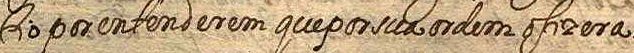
tio por entenderem que por sua ordem o fizera.
